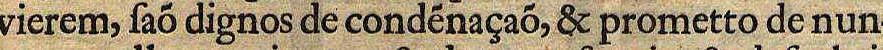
vierem, saõ dignos de condēnaçaõ, & prometto de nun
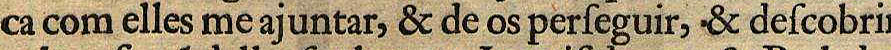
ca com elles me ajuntar, & de os perseguir, & descobrir
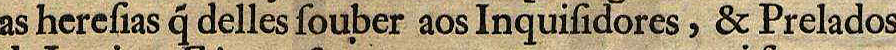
as heresias q̄ delles souber aos Inquisidores, & Prelados
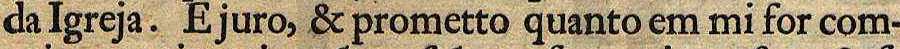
da Igreja. E juro, & prometto quanto em mi for com
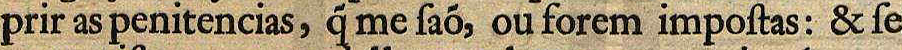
prir as penitencias, q̄ me saõ, ou forem impostas: & se
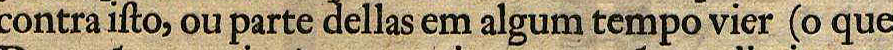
contra isto, ou parte dellas em algum tempo vier (o que
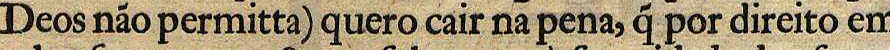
Deos não permitta) quero cair na pena, q̄ por direito em
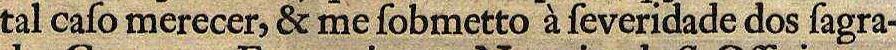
tal caso merecer, & me sobmetto à severidade dos sagra
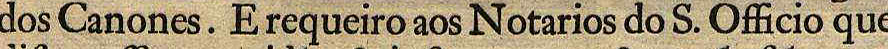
dos Canones. E requeiro aos Notarios do S. Officio que
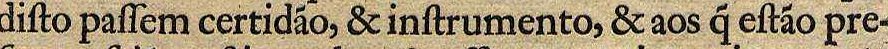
disto passem certidão, & instrumento, & aos q̄ estão pre
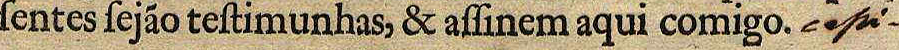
sentes sejão testimunhas, & assinem aqui comigo. e assi
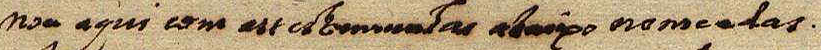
nou aqui com as testemunhas abaixo nomeadas.
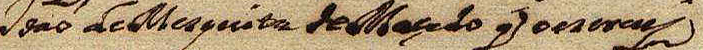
Ioaõ de Mesquita de Maçedo q̄ o escreuj
